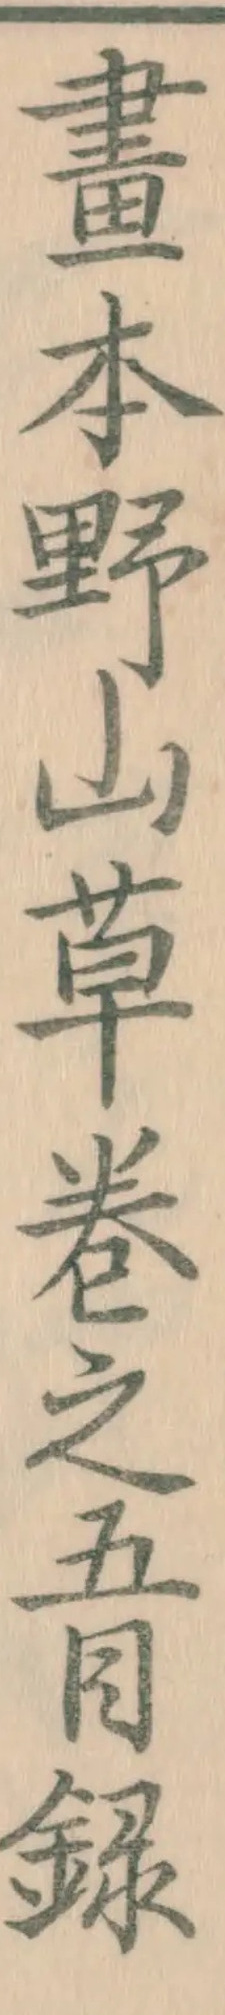画本野山草巻之五目録
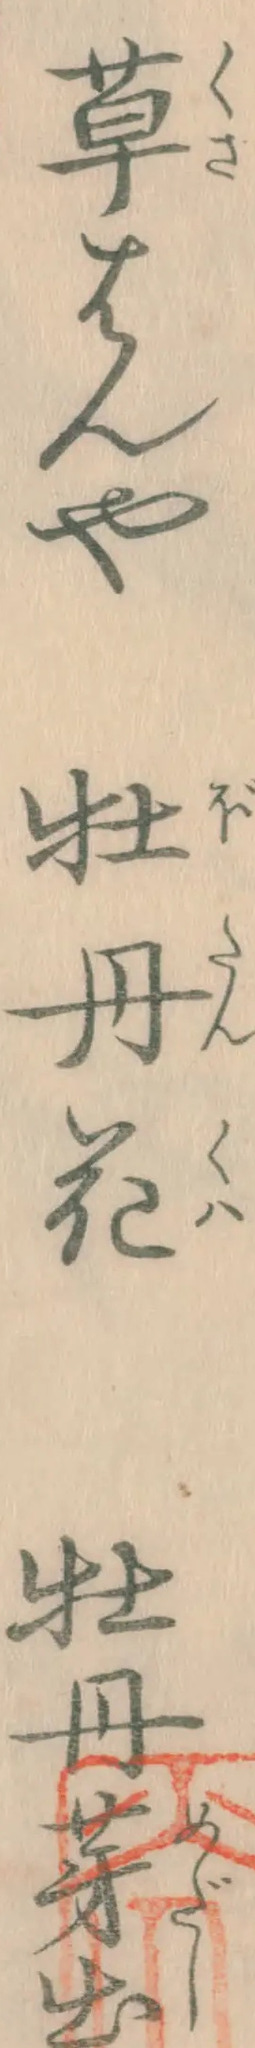草はんや牡丹花牡丹芽出
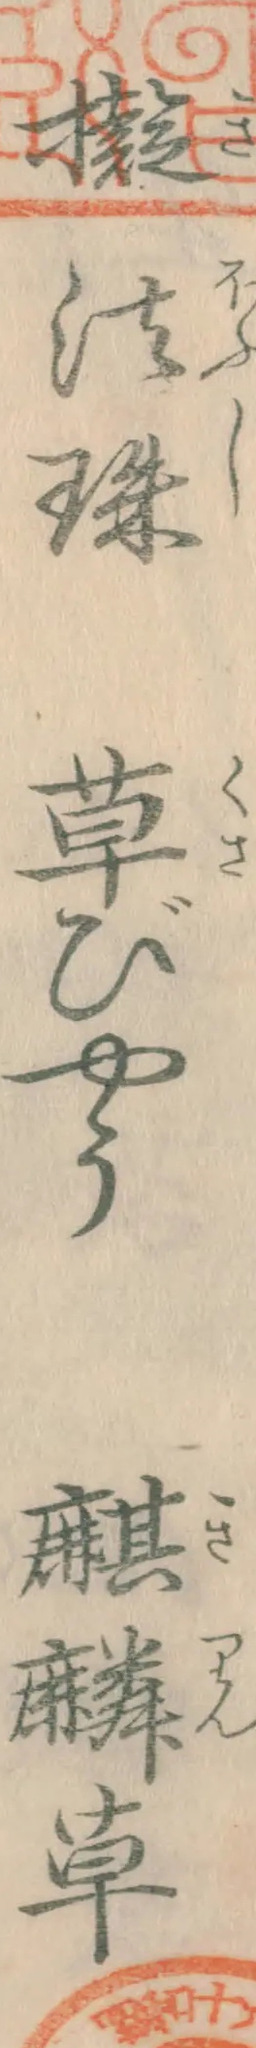擬法珠草びやう麒麟草
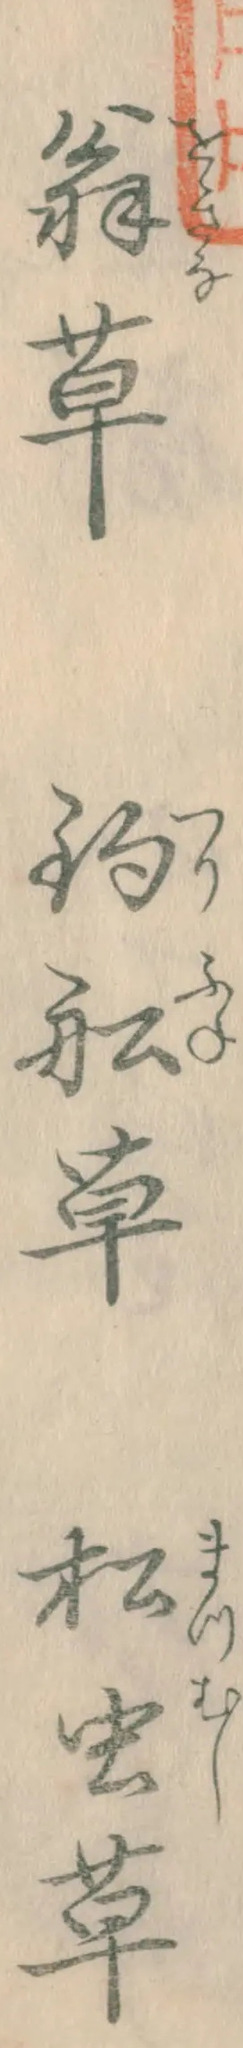翁草釣船草松虫草
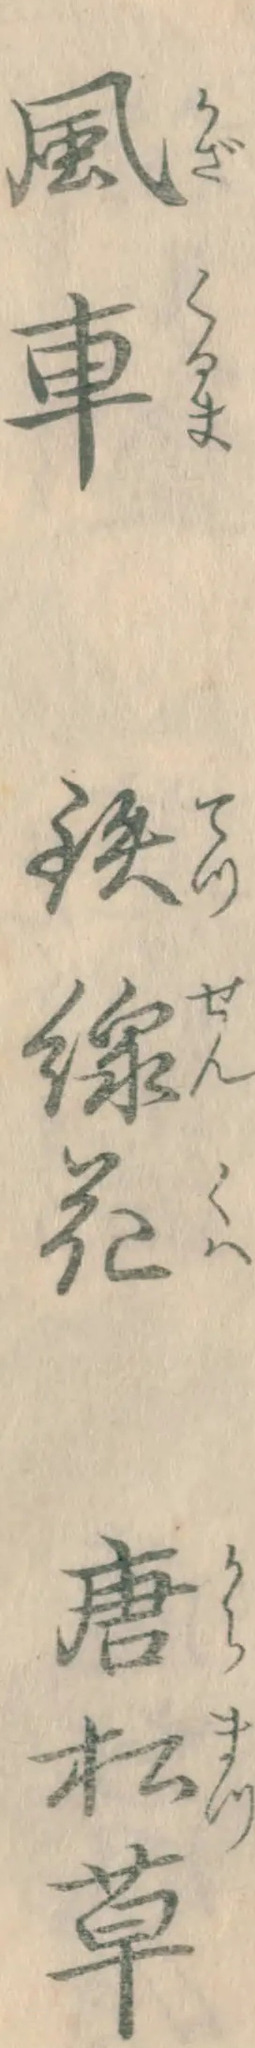風車鉄線花唐松草

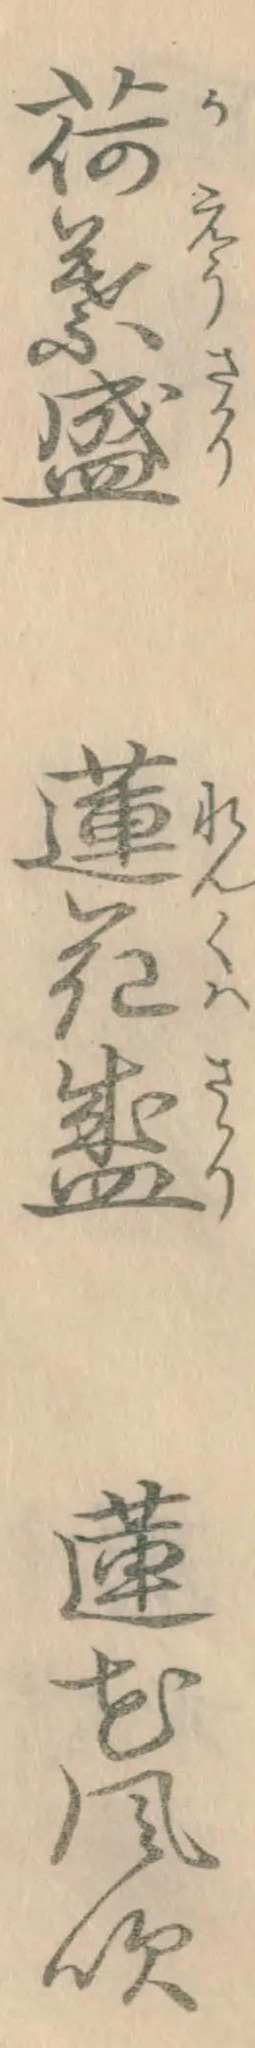荷葉盛蓮花盛蓮花風吹
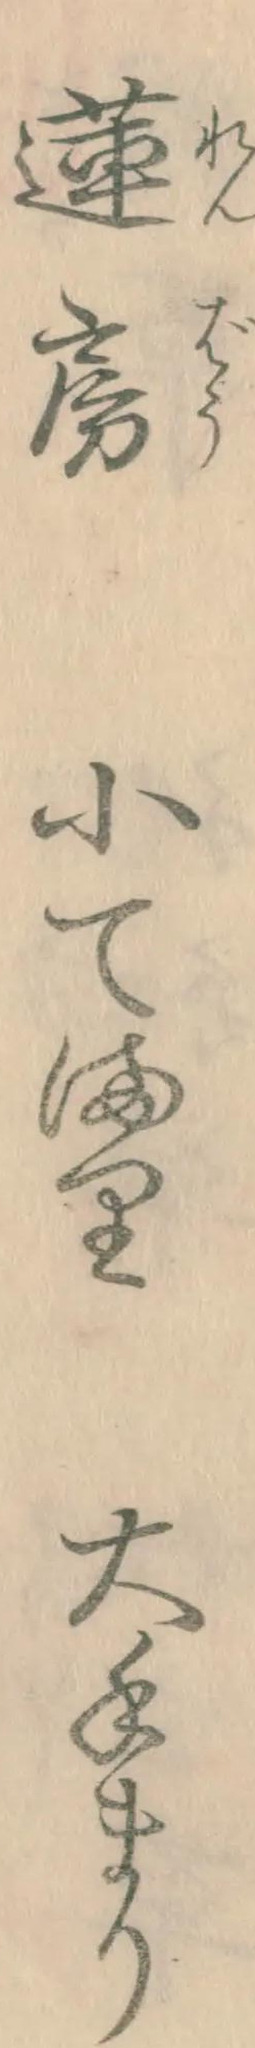蓮房小てまり大手まり
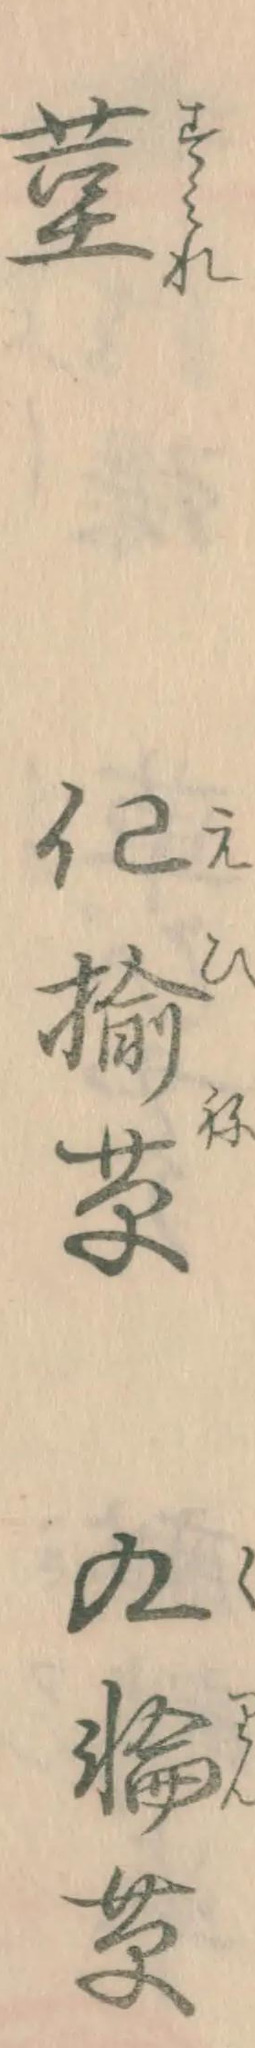菫化揄草九輪草
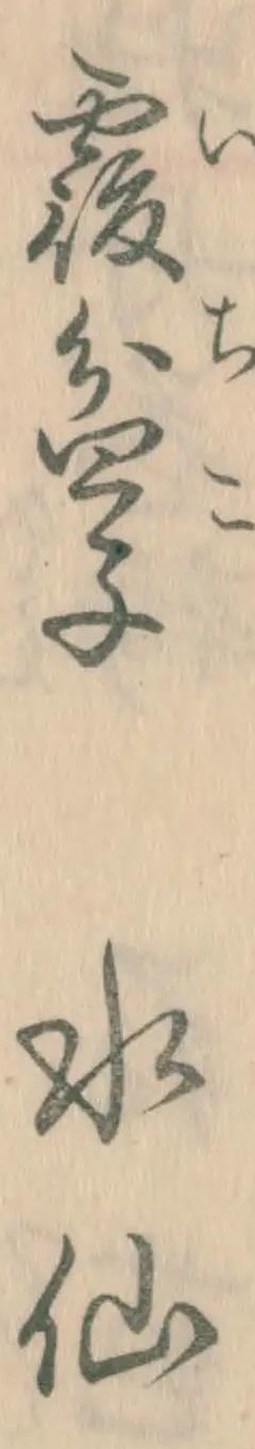覆盆子水仙
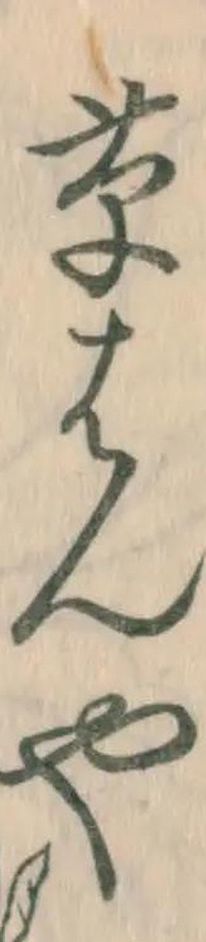草はんや
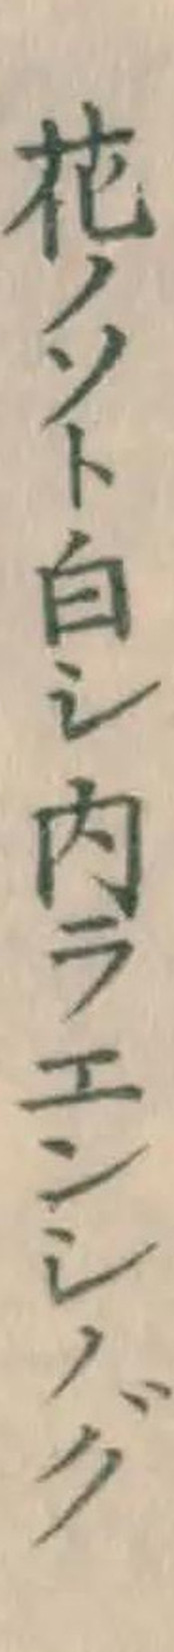花ノソト白シ内ラエンシノグ
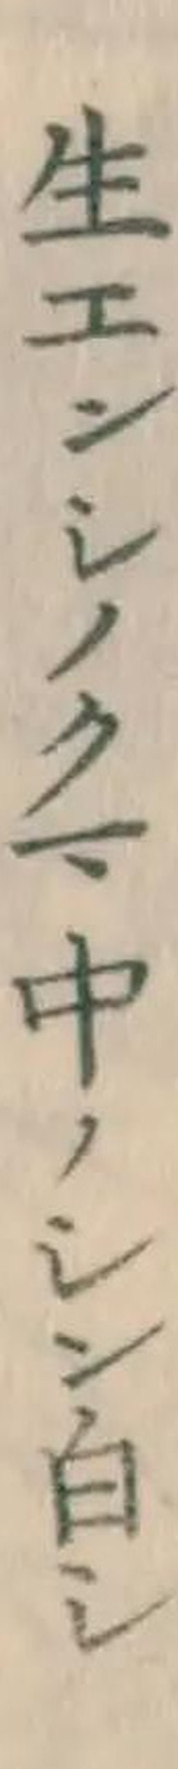生エンシノクマ中ノシン白シ
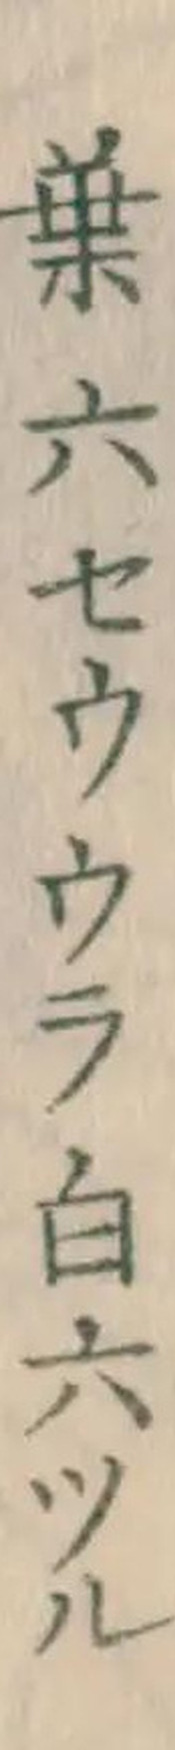葉六セウウラ白六ツル
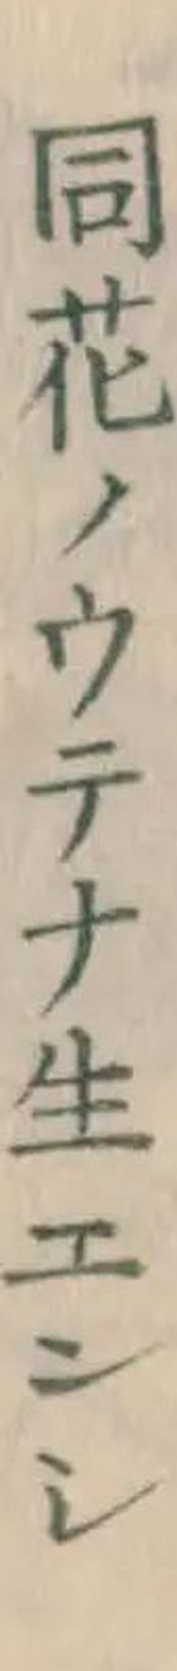同花ノウテナ生エンシ
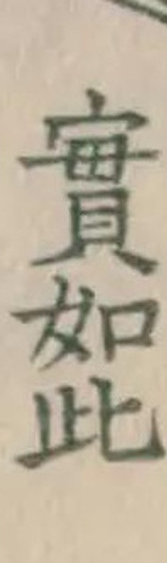実如此

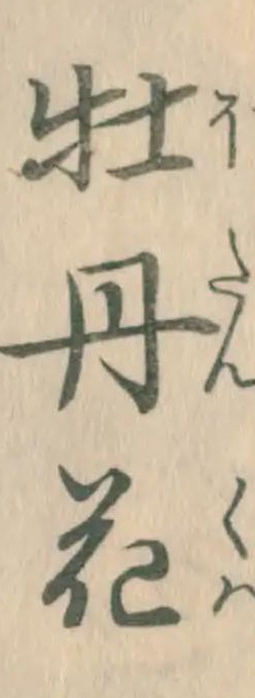牡丹花
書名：畫本野山草. [5]
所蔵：国立国会図書館 National Diet Library, JAPAN
